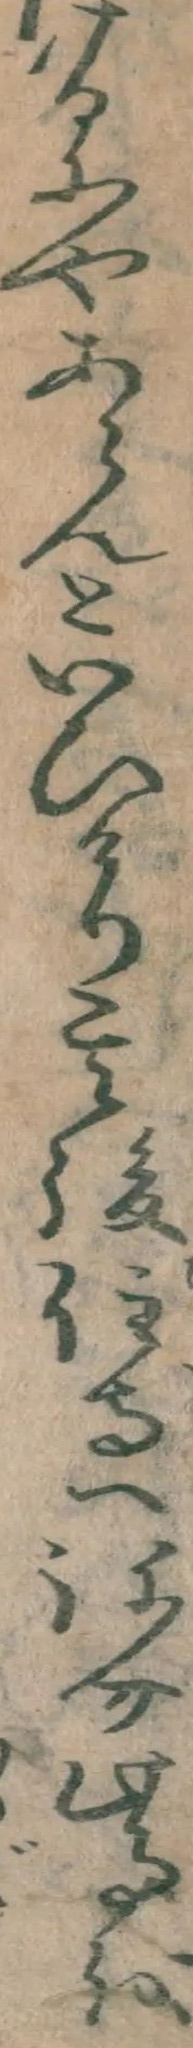えるにやあらんといひけり其後住寺へ弥介此事を
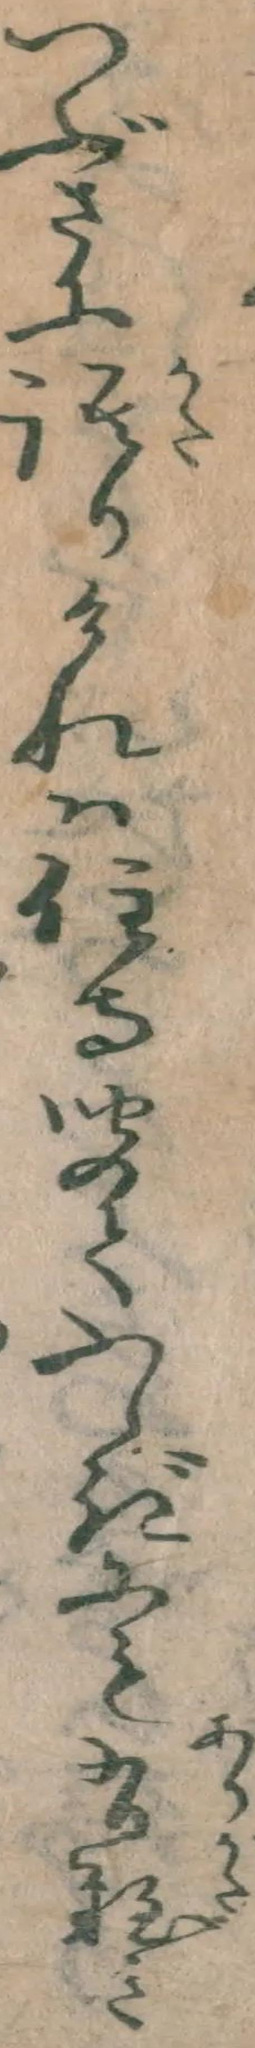つぶさに語りけれは住寺聞てふしぎにも有難き
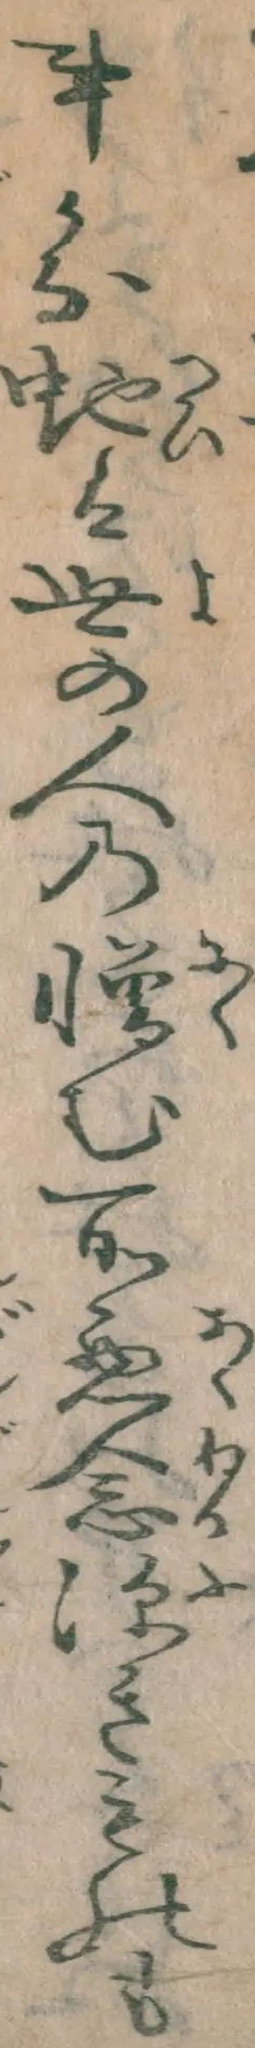事かな蛇は世の人の憎む所悪念深きものも
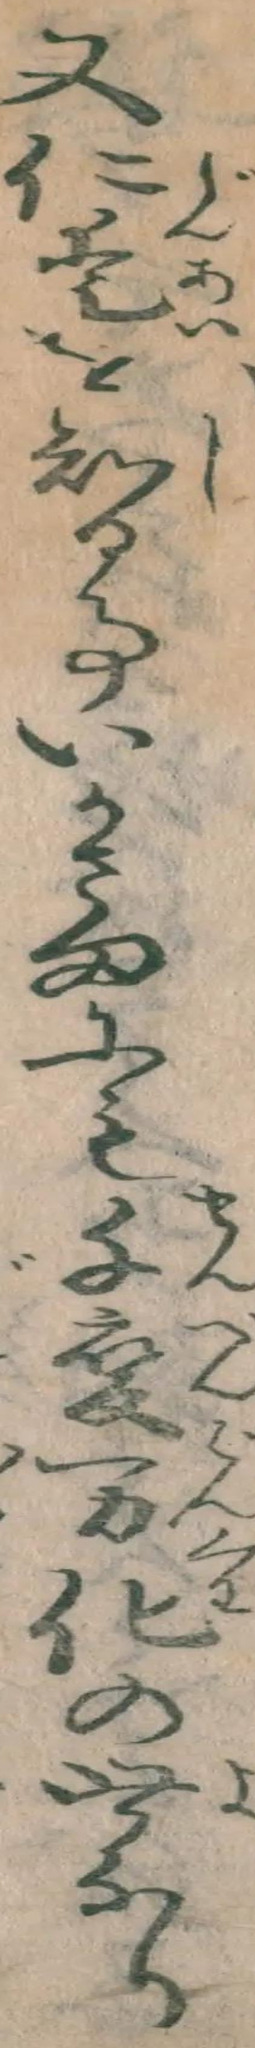又仁愛を知る事いかさまにも千変万化の世なり
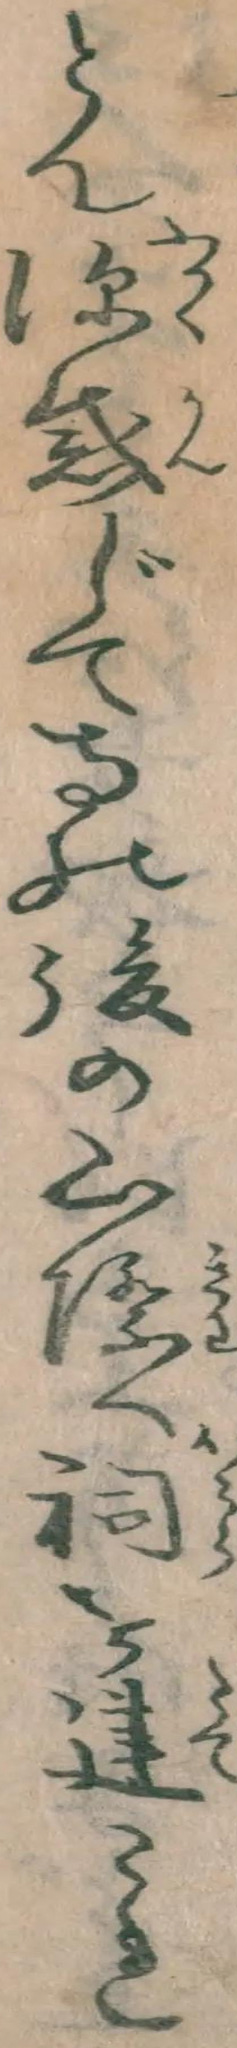とて深感じて寺の後の山際へ祠を建ら？れ
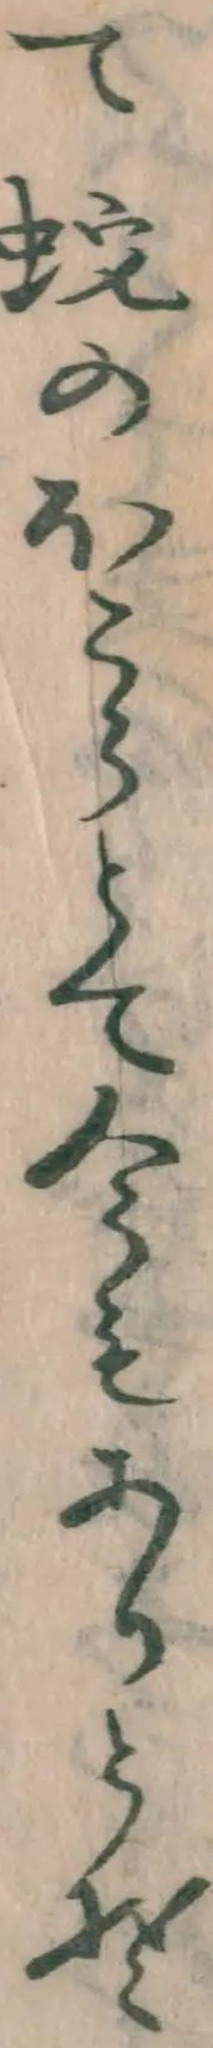て蛇のほこらとて今もありとぞ
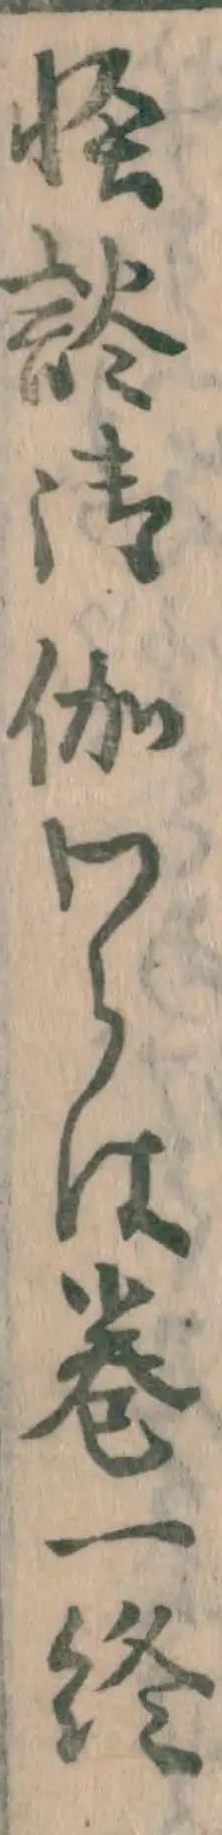怪談御伽わらは巻一終

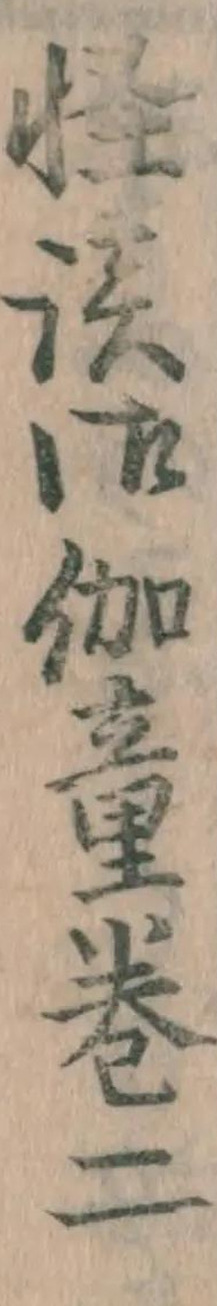怪談御伽童巻二
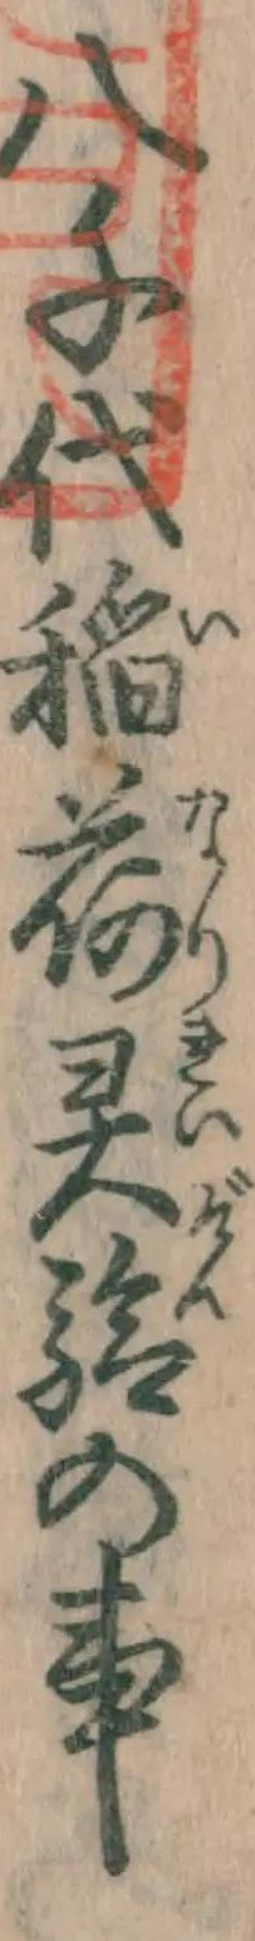八千代稲荷霊験の事
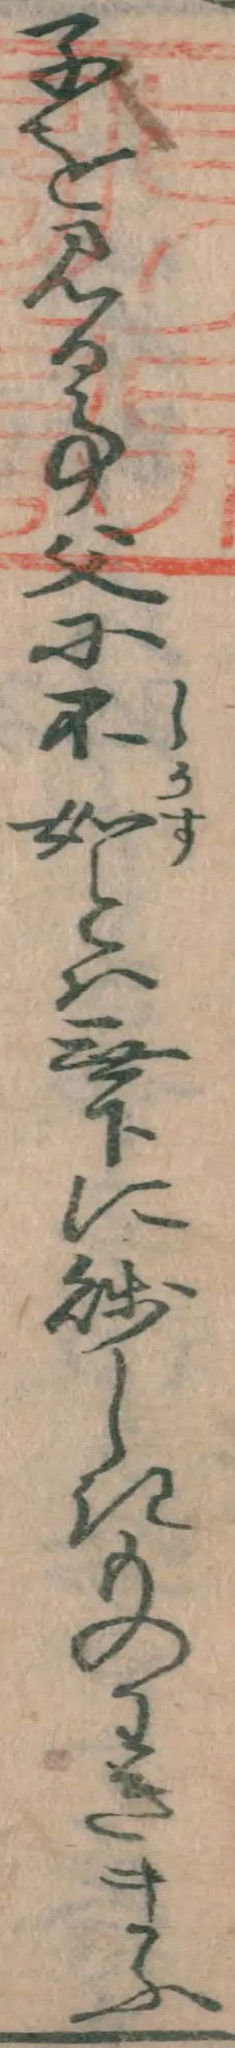子を見る事父に不如とは無下に賎しきものわきまふ
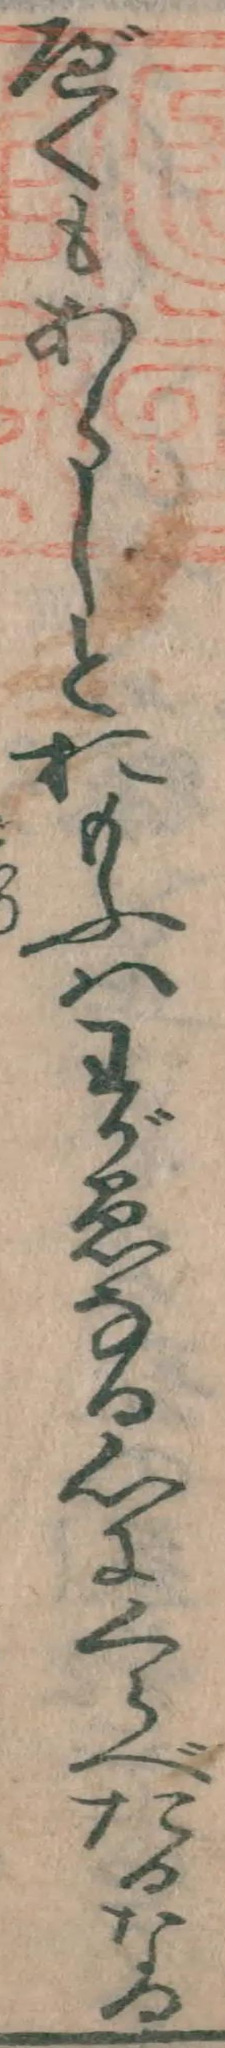べくもあらしとおもふはわが愚なる心にくらべたるなる
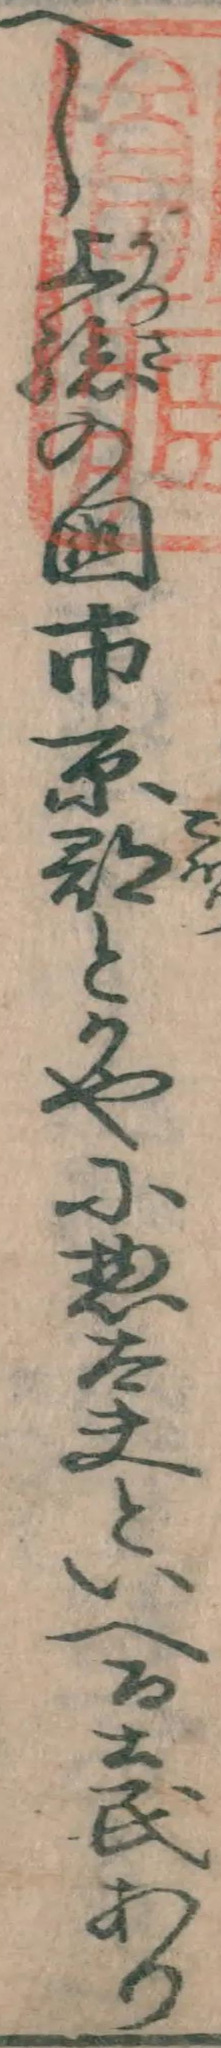へし上総の国市原郡とかやに惣太夫といへる土民あり
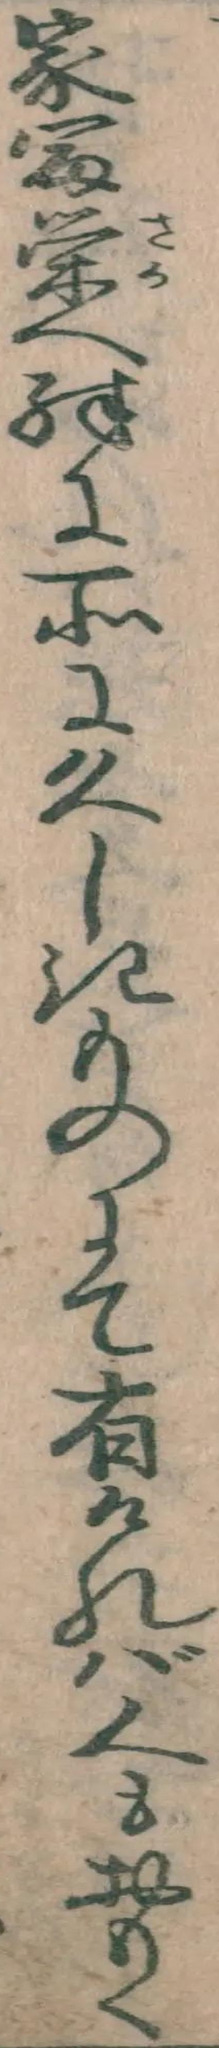家富栄へ殊に所に久しきものにて有ければ人もおもく
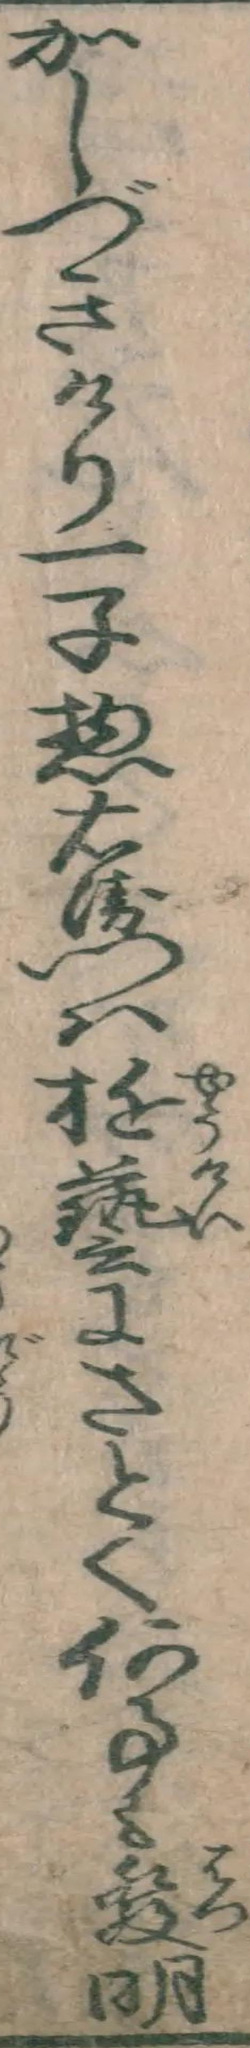かしづきけり一子惣右衛門は遊芸にさとく何事も発明
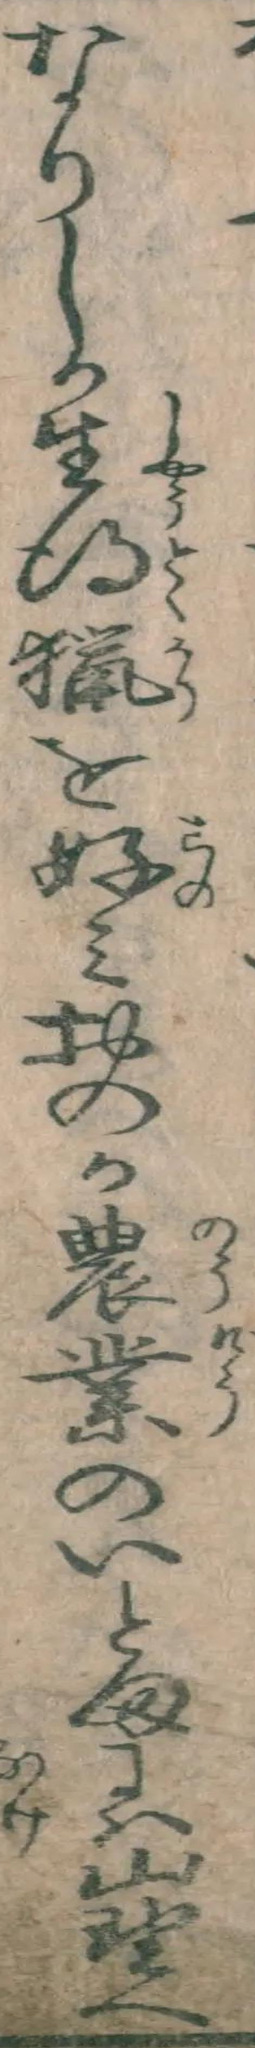なりしか生得猟を好みおのか農業のいとまには山野へ
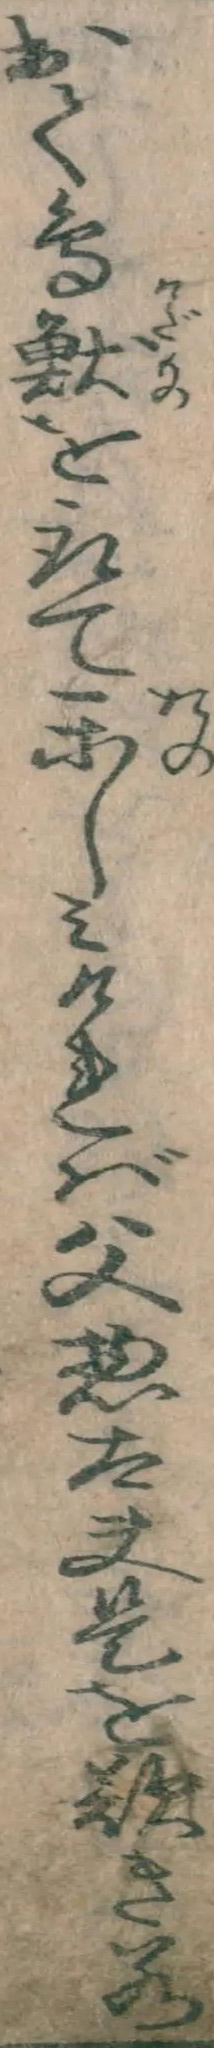出て鳥獣を取て楽しみければ父惣太夫是を歎き若
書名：怪談御伽童 5巻. [1]
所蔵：国立国会図書館 National Diet Library, JAPAN
